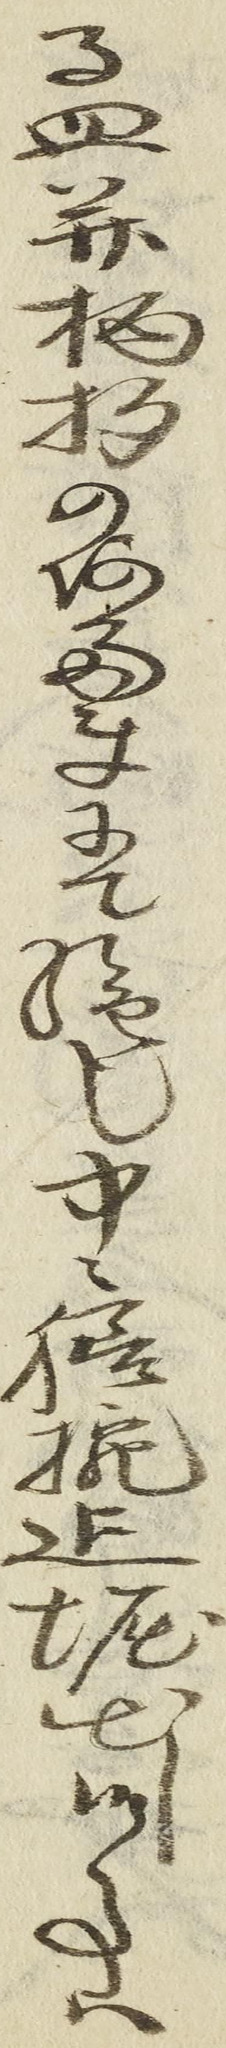る皿并柄杓のあたまにて給申候中々膳椀迄堀出し候事ハ
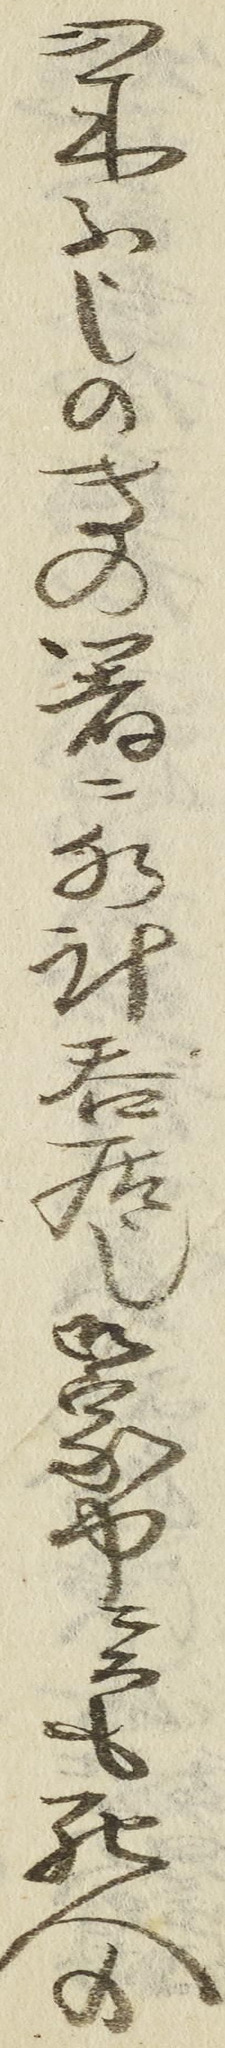出来不申候のきの箸二水計呑居申候御家中二而も死人の
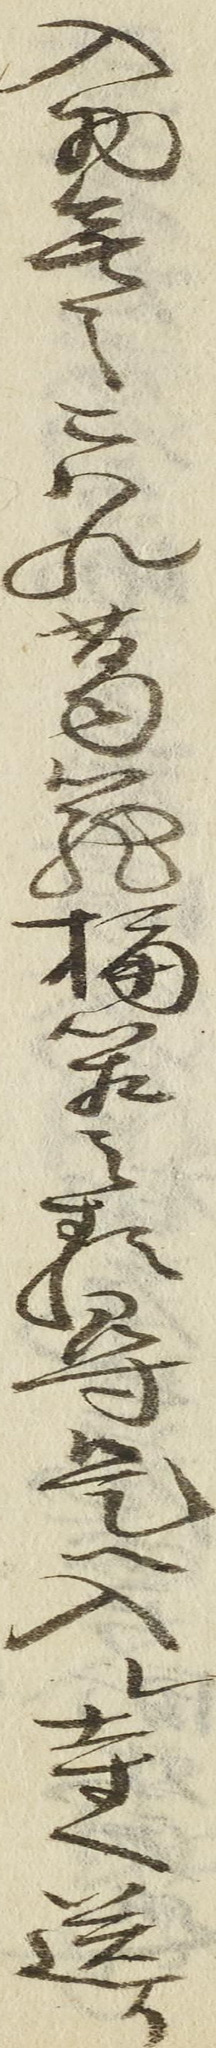入物無之こハれ葛籠桶箱の類尋是へ入ㇾ寺へ送り
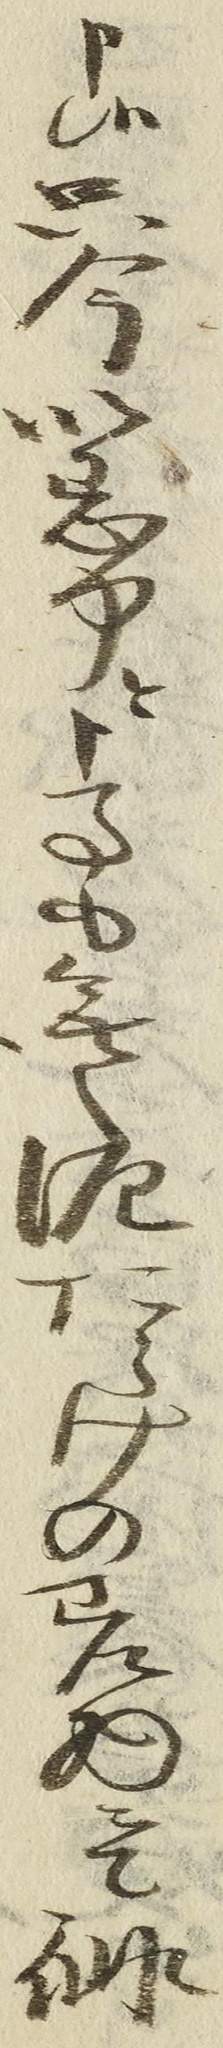申候只今御恐中と申事も無之泥たらけの差物二て修
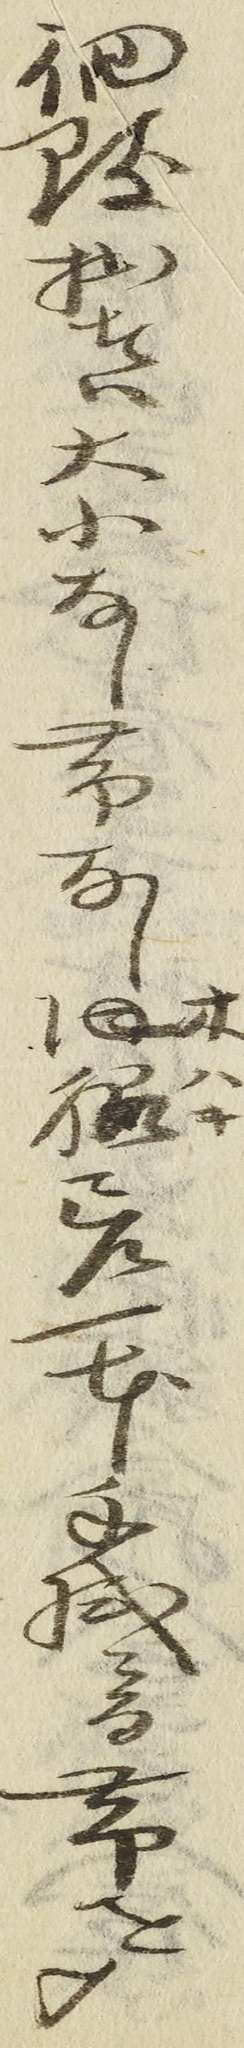復致拙者ハ大小なし帯なし木脇差一本手拭二而帯を〆
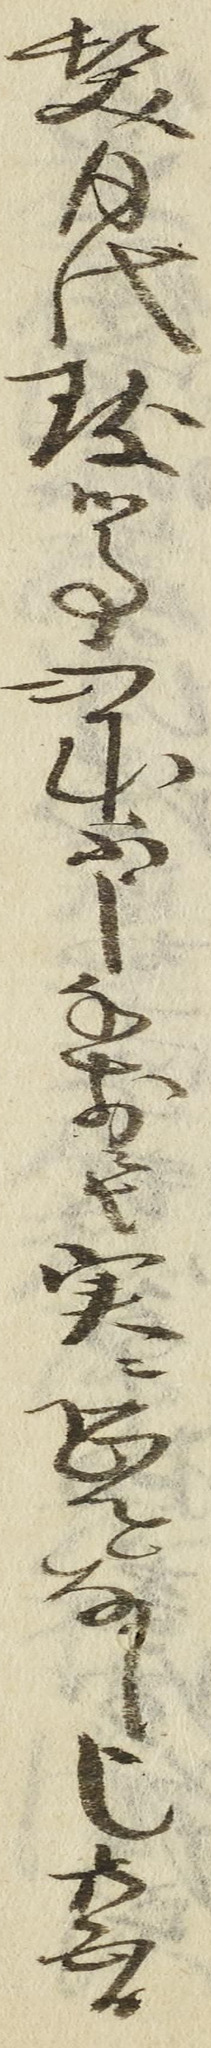髪月代致候事出来不申手前二は実二恐をなし申候廿五日
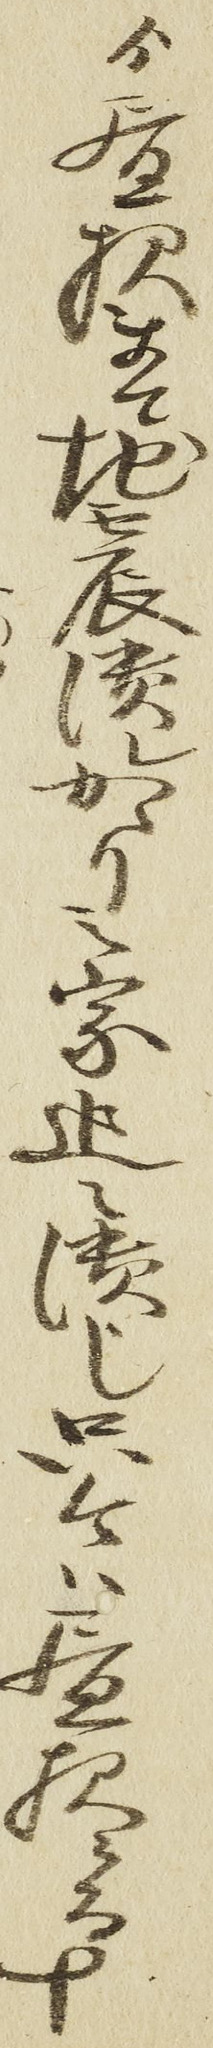ゟ昼夜まで地震潰かゝり之家追々潰申候只今ハ昼夜二而十
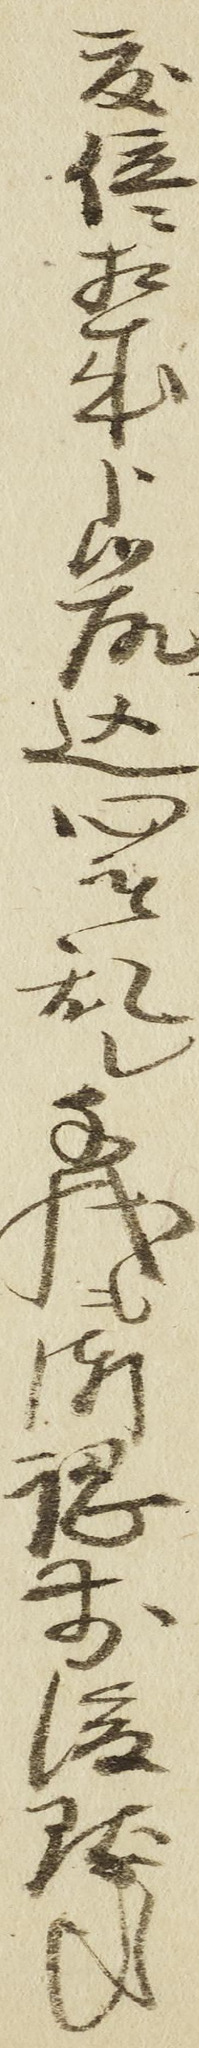度位二相成申候取込心は乱ㇾ手紙も漸認前後致し申候
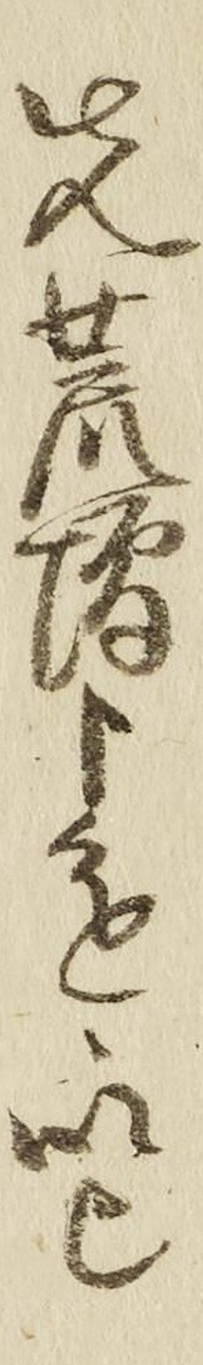先荒増申遣候以上
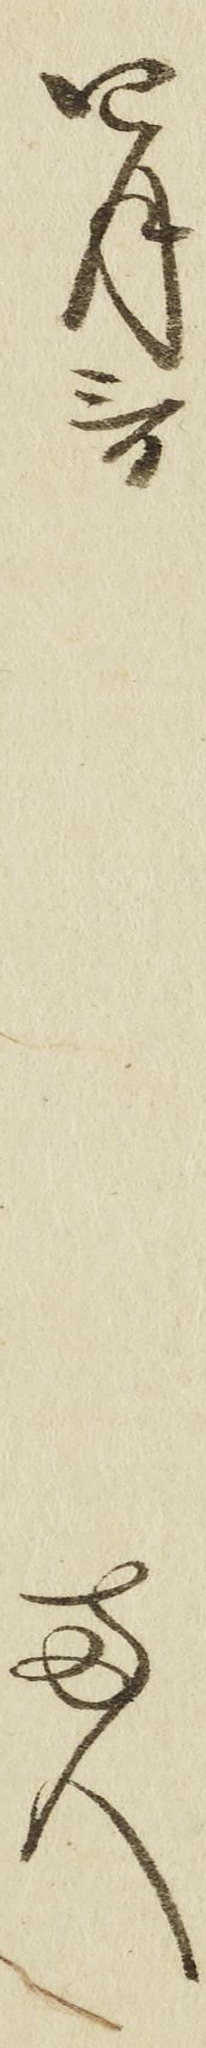四月三日両人
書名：信濃國大地震記　乾
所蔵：東京大学地震研究所図書室 Earthquake Research Institute Library, The University of Tokyo, JAPAN
